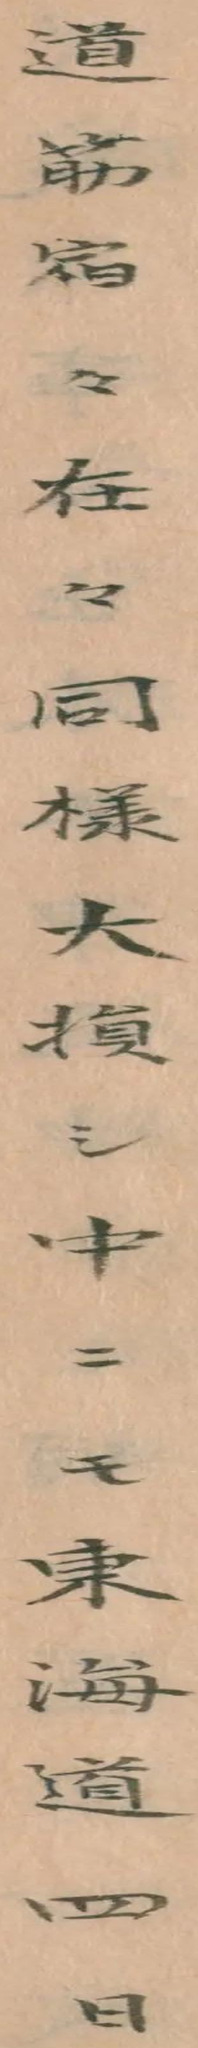道筋宿々在々同様大損シ中ニモ東海道四日
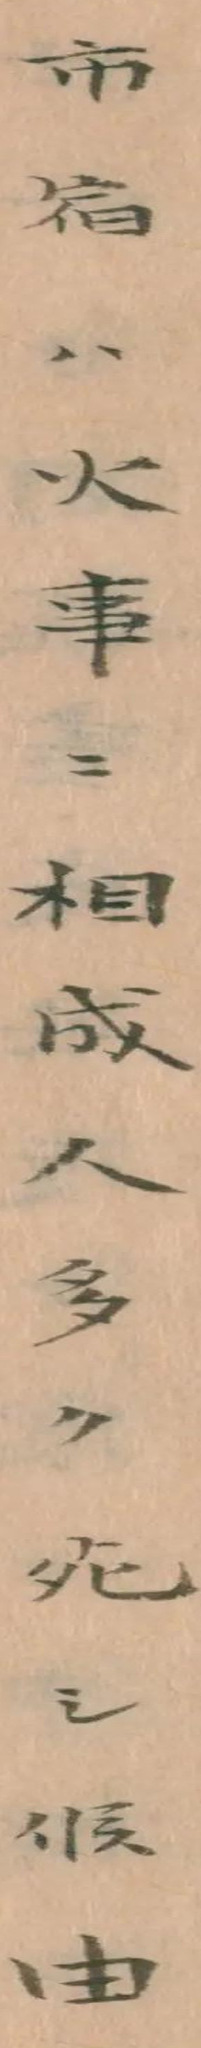市宿ハ火事二相成人多ク死シ候由
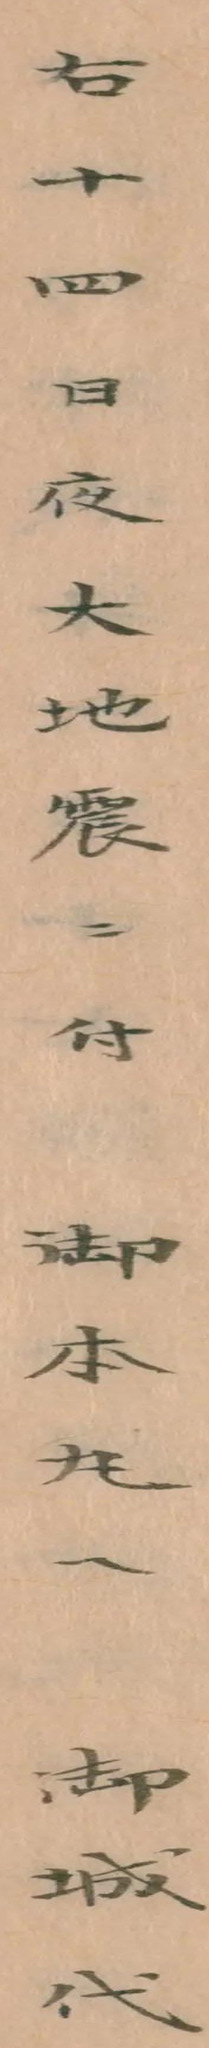一右十四日夜大地震二付御本丸へ御城代
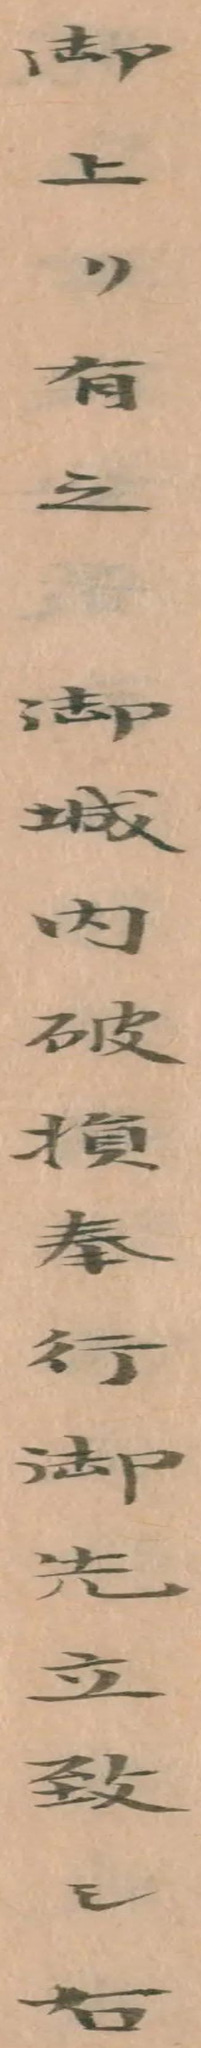御上り有之御場内破損奉行御先立致シ右
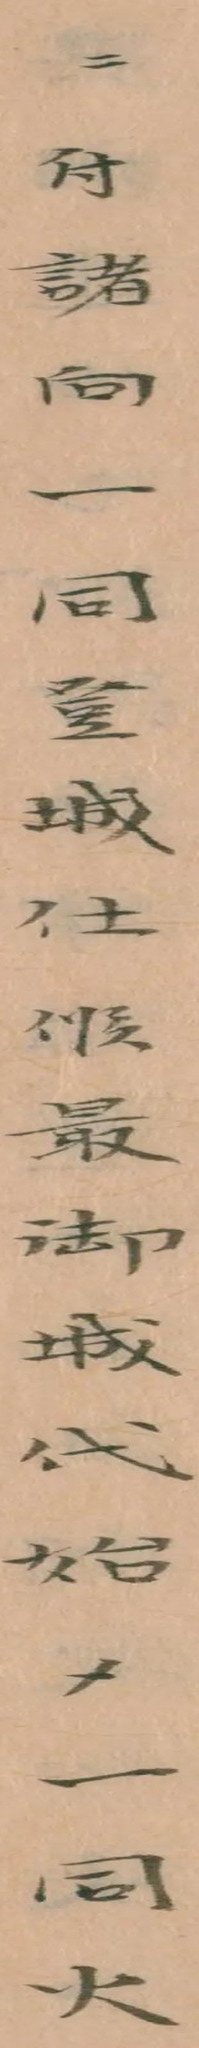二付諸向一同登城仕候最御城代始メ一同火
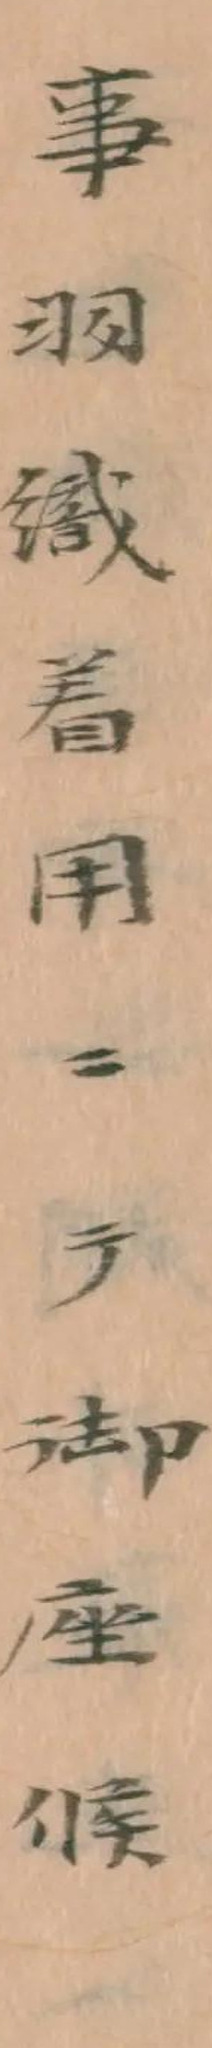事羽織着用ニテ御座候
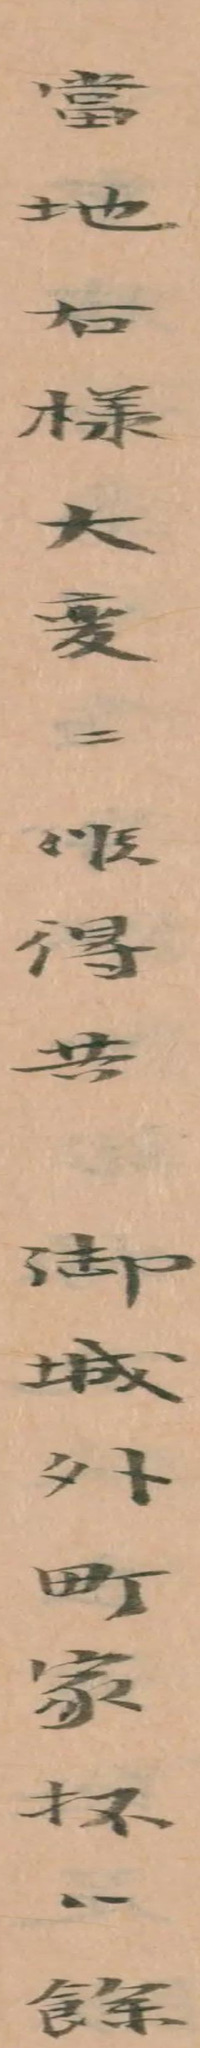一当地右様大変二候得共御城外町家抔ハ余
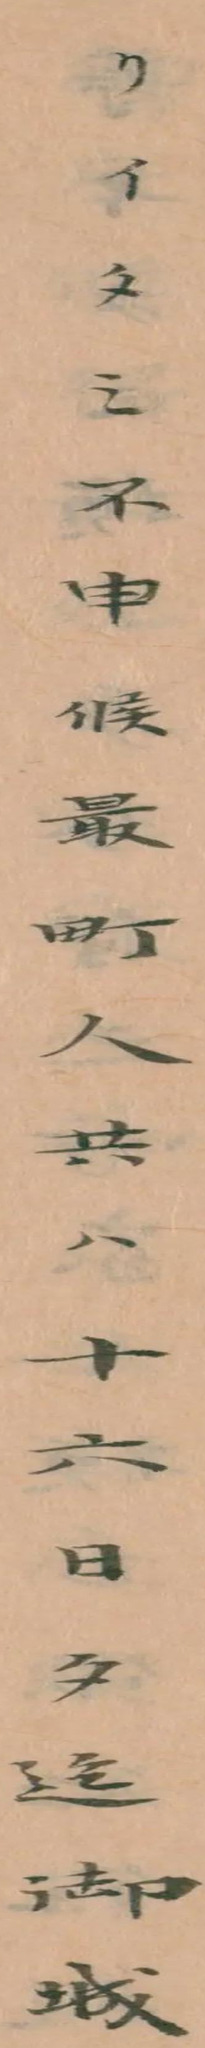りイタミ不申候最町人共ハ十六日夕迄御城
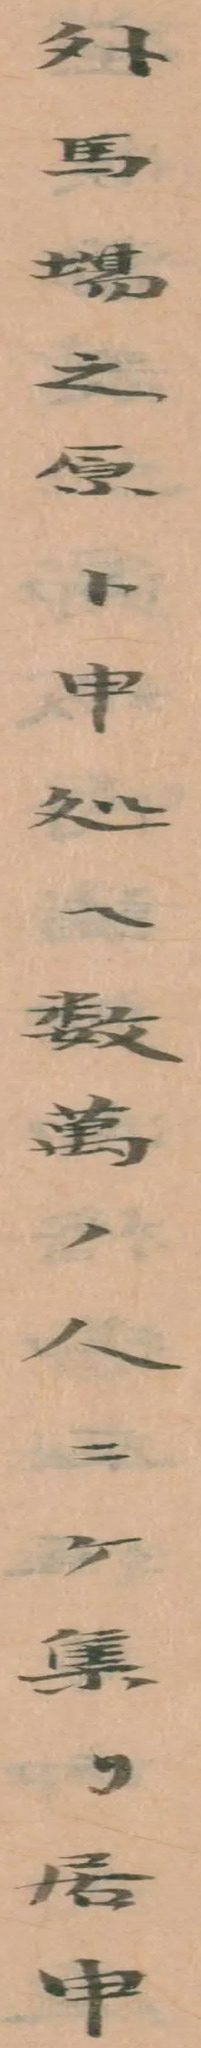外馬場之原ト申処へ数万ノ人ニケ集り居申
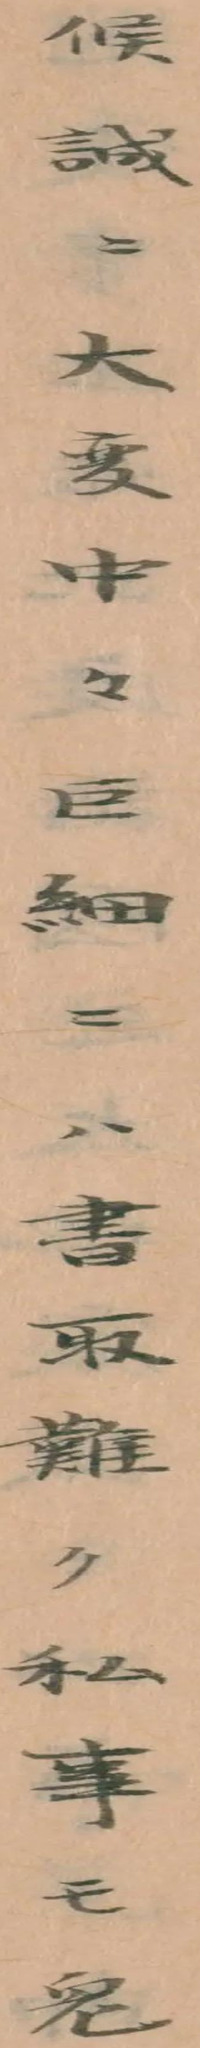甲誠二大変中々巨細ニハ書取難ク私事モ兎
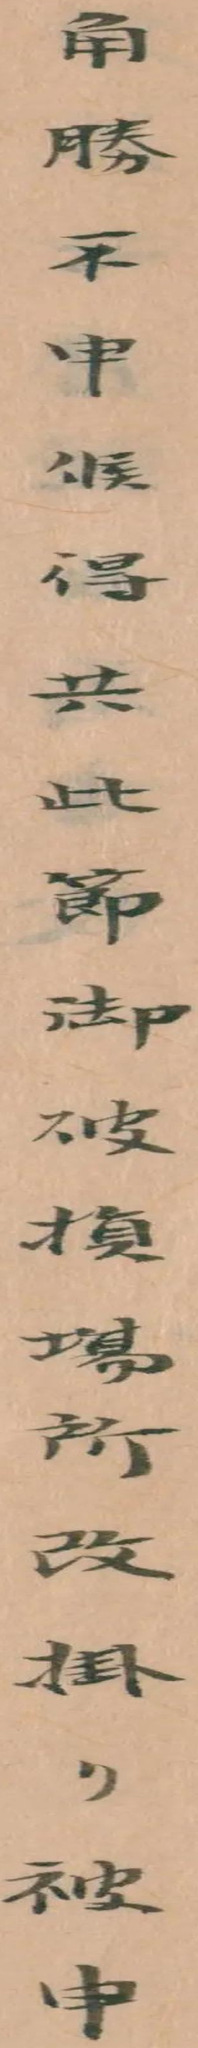角勝不申候得共此節御破損場所改掛り被申
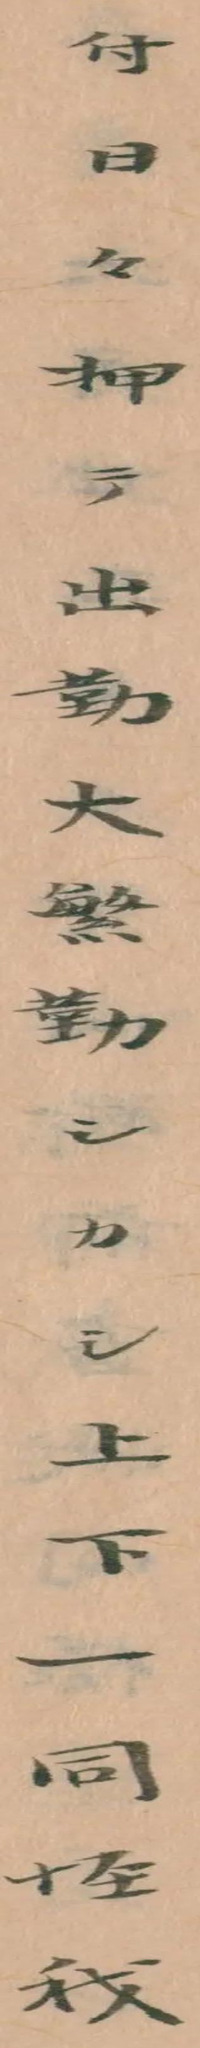付日々押テ出勤大繁勤シカシ上下一同怪我
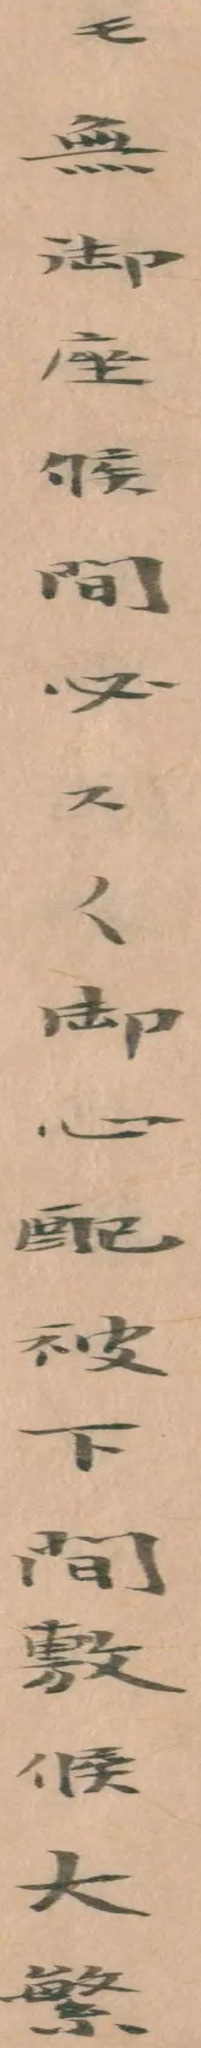モ無御座候間必ス〳〵御心配被下間敷候大繁
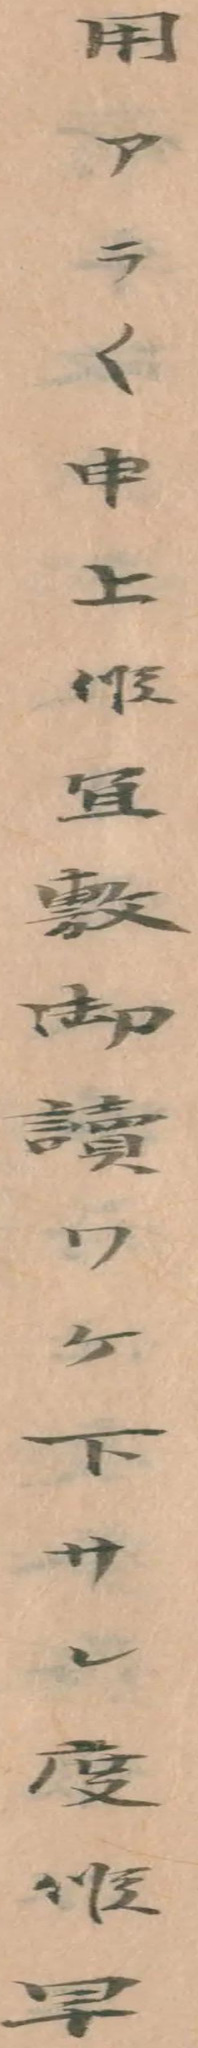用アラ〳〵申上候宜敷御読ワケ下サレ度候早
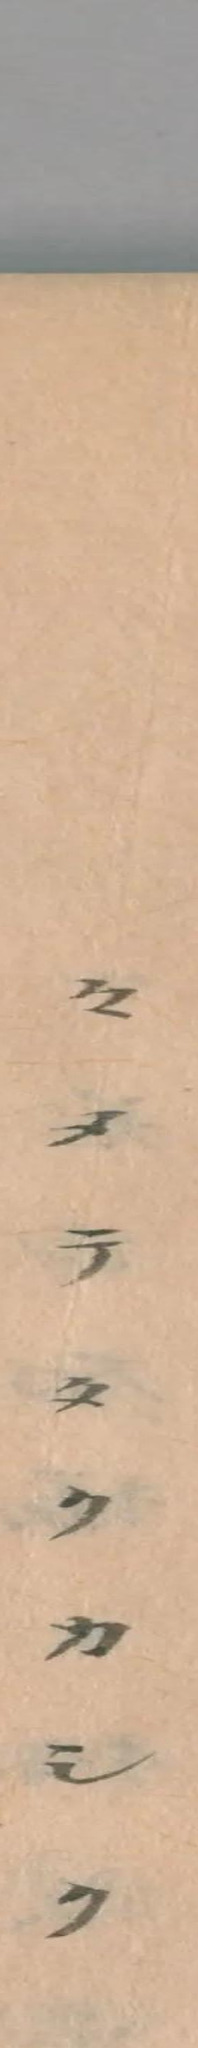々メテタクカシク
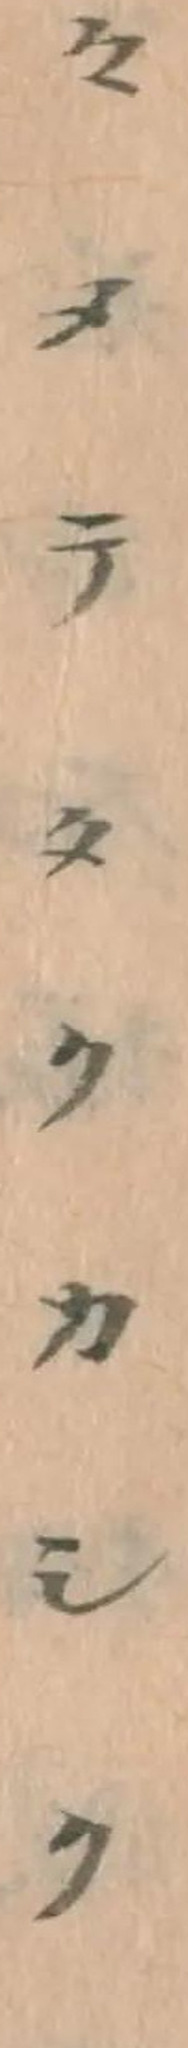々メテタクカシク
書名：地災撮要. 巻1(噴火山・地震ノ部)
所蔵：国立国会図書館 National Diet Library, JAPAN
